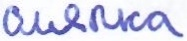оляпка
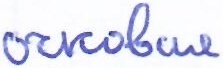очковая
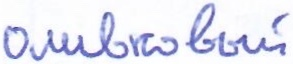оливковый
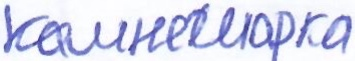камнешарка
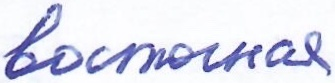восточная
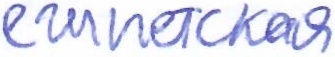египетская
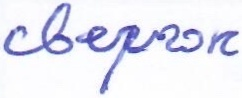сверчок
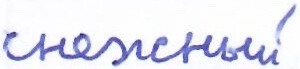снежный
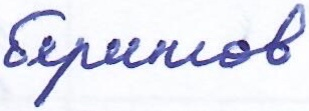берингов
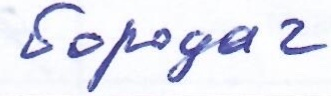бородач
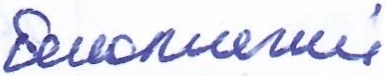белоплечий
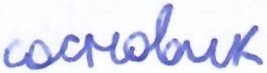сосновик
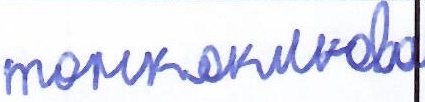тонкоклюва
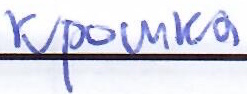крошка
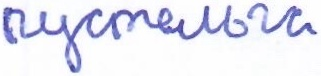пустельга
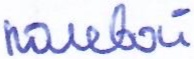полевой
